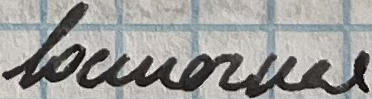восточная
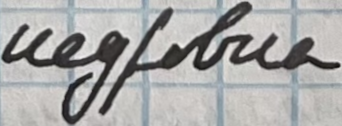кедровка
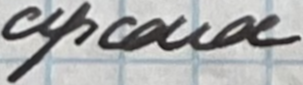сухонос
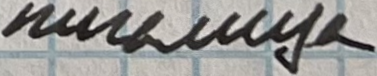пигалица
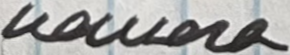конюга
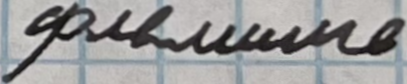фламинго
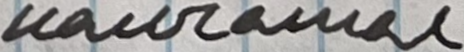кольчатая
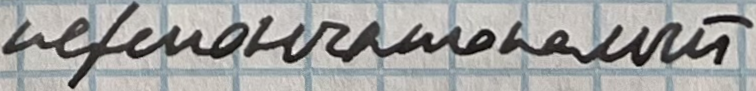перепончатопалый
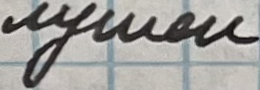луток
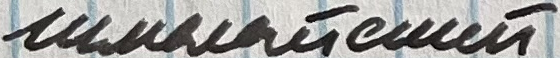гималайский
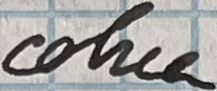совка
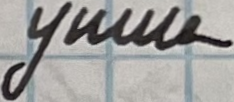утка
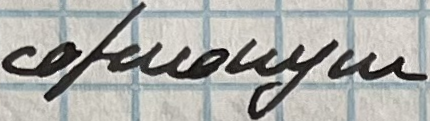сорокопут
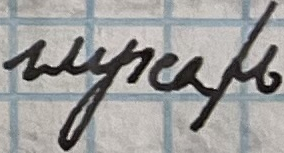глухарь
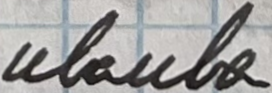кваква
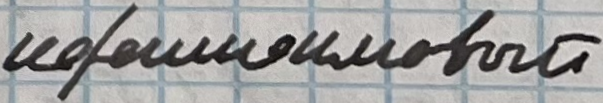короткоклювый
